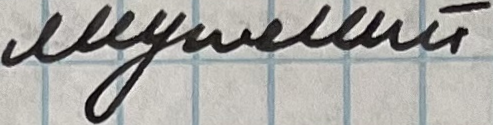якутский
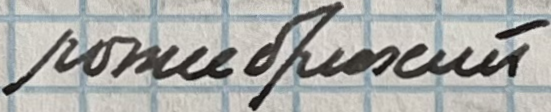рыжебрюхий
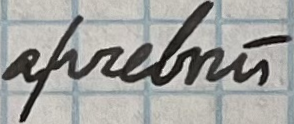арчевый
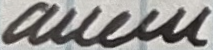аист
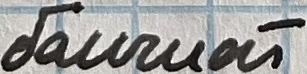большой
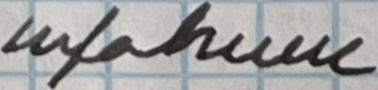травник
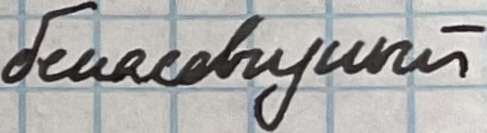бекасовидный
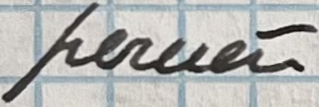речной
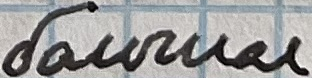большая
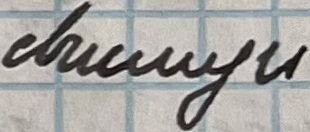свистун
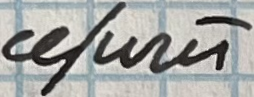серый
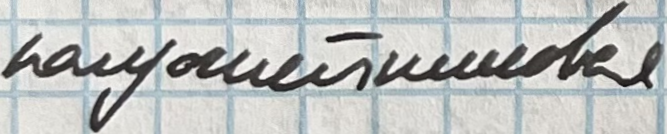полуошейниковая
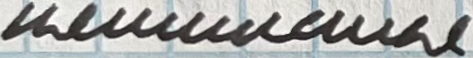пятнистая
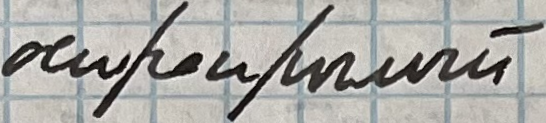острокрылый
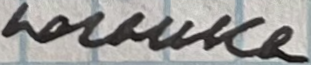поганка
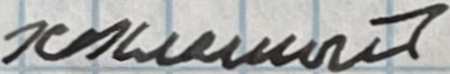хохлатый
